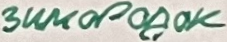зимородок
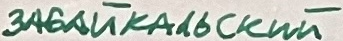забайкальский
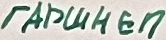гаршнеп
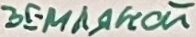земляной
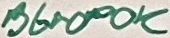вьюрок
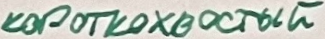короткохвостый
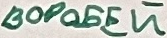воробей
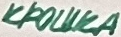крошка
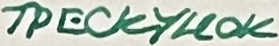трескунок
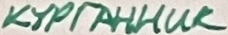курганник
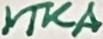утка
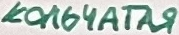кольчатая
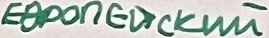европейский
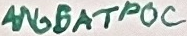альбатрос
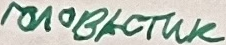головастик
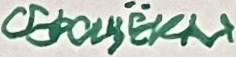серощёкая
